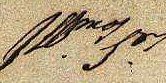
Jll.mos s.rs
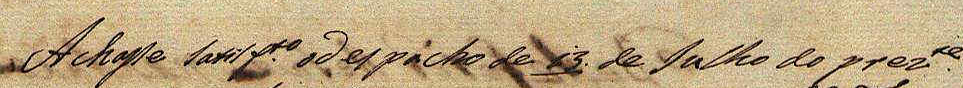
Achasse satisf.to o despacho de i3. de Iulho do prez.te
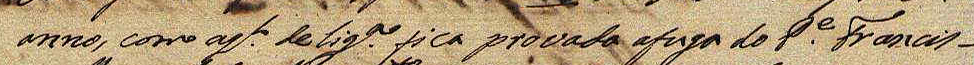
anno, como a q.l delig.a fica provada a fuga do P.e Francis
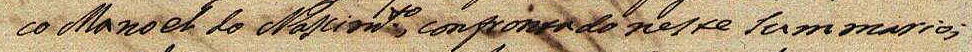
co Manoel do Nascim.to confrontado neste summario;
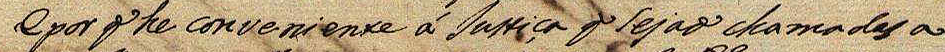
e porq̄ he conveniente á Iustiça q̄ sejaõ chamadas a
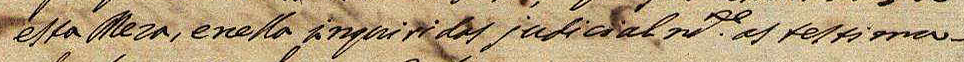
esta Meza, e nella inquiridas judicialm.te as testimu
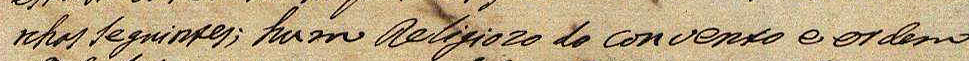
nhas seguintes; hum Religiozo do convento e ordem
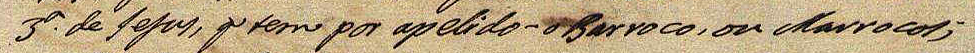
3.a de Iesus, q̄ tem por apelido = o Barroco, ou Marrocos;
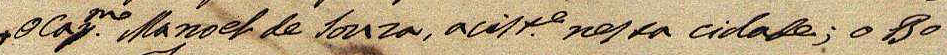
o cap.m Manoel de Souza, acist.e nesta cidade; o Bo
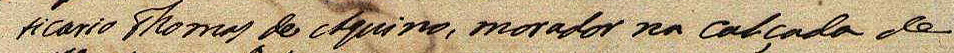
ticario Thomas de Aquino, morador na calçada de
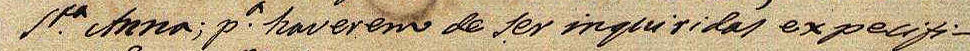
st.a Anna; p.a haverem de ser inquiridas expecifi
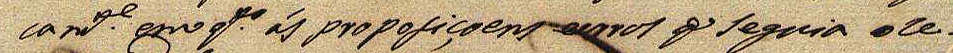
cam.te emq.to ás proposiçoens e erros q̄ seguia o re
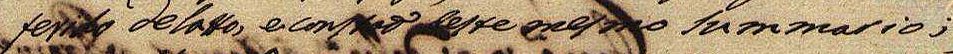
ferido delatto, e constar deste mesmo summario;
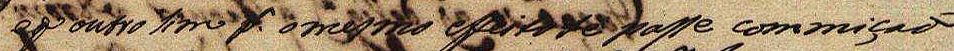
e q̄ outrosim p̄. o mesmo effeito se passe commiçaõ
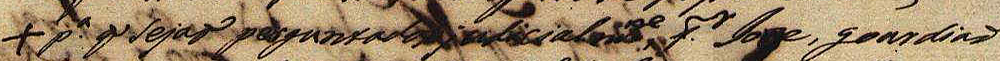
+ p.a q̄ sejaõ perguntados judicialmte s.r Io_e, goardiaõ
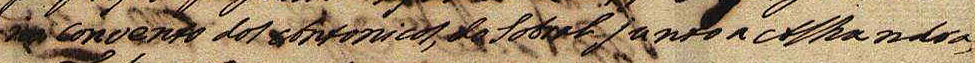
no convento dos Antonicos, de Sobral junto a Alhandra,
